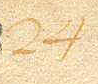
24.
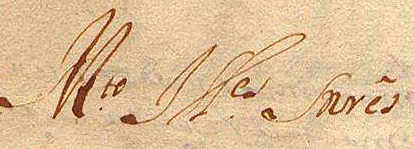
M.to Ill.es Snrēs
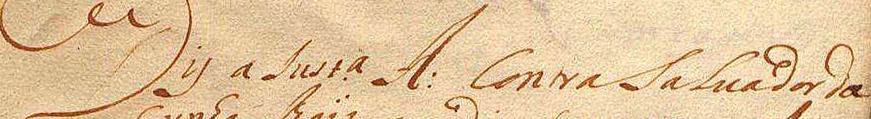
Dis a Iust.a A: Contra Saluador da
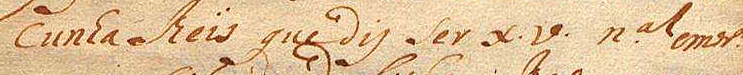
cunha Reis que dis ser x. v. n.al e mor.
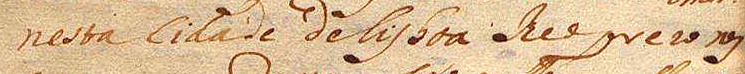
nesta Cidade de lisboa Reo prezo nos
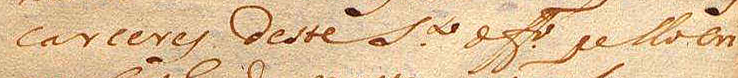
carceres deste s.to off.o pello cri
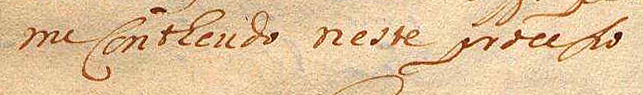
me Contheudo neste processo
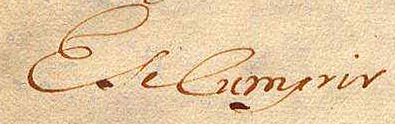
E se Cumprir
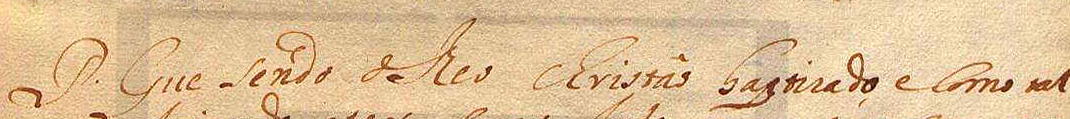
P. Que sendo o Reo christaõ baptizado, e Como tal
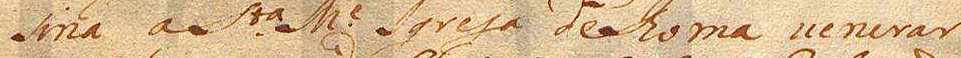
sina a S.ta M.e Igreja de Roma uenerar
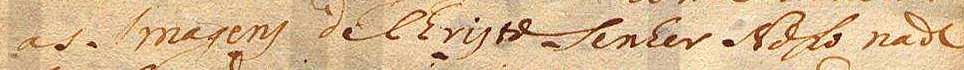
as Imagens de Christo Senhor Nosso naõ
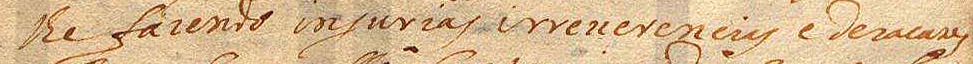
lhe fazendo injurias irreuerencias e dezacatos
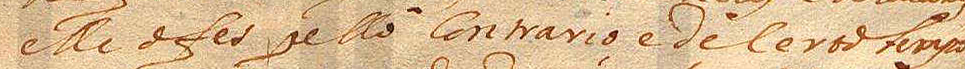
elle o fes pello contrario, e de certo tempo
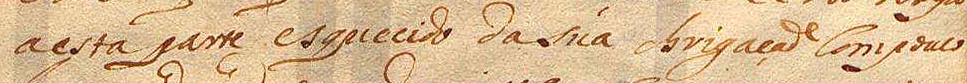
a esta parte esquecido da sua obrigaçaõ Com pouco
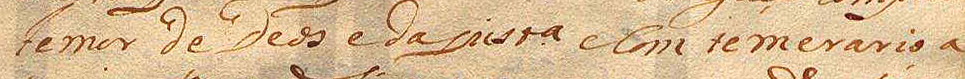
temor de Deos e da just.a e com temerario a
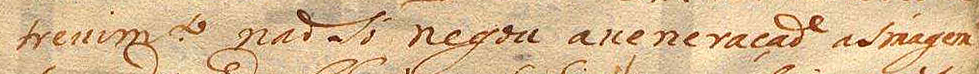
treuim.to naõ só negou a ueneraçaõ a Imagem
